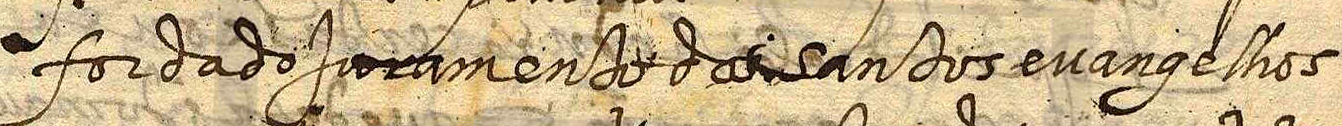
foi dado Juramento dos santos euangelhos
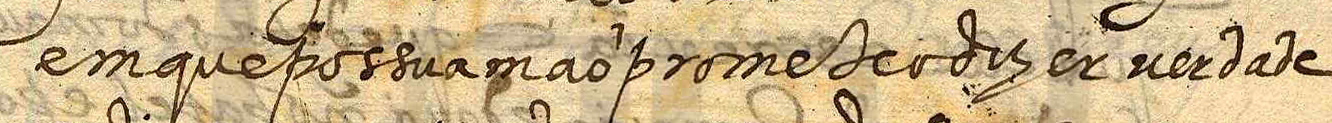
em que pos sua maõ prometeo dizer uerdade
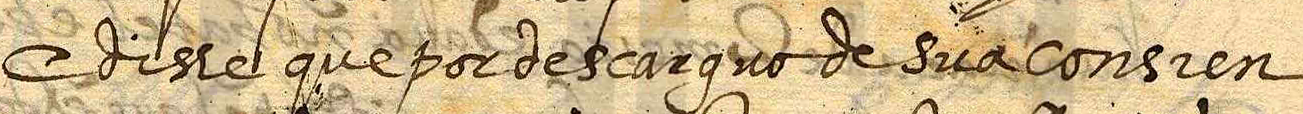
e disse que por descarguo de sua consien
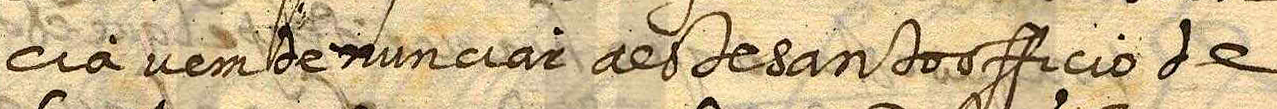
cia uem denunciar a este santo officio de
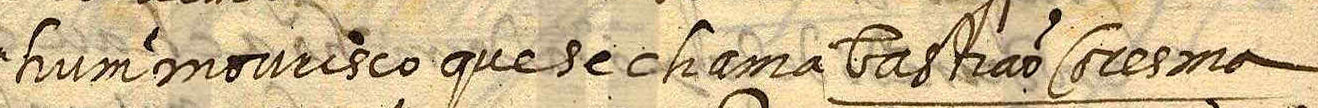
hum mourisco que se chama bastiaõ Coresma
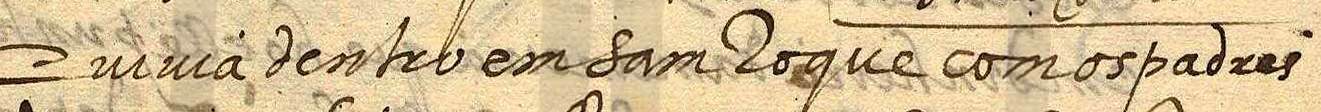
E uiuia dentro em sam Roque com os padres
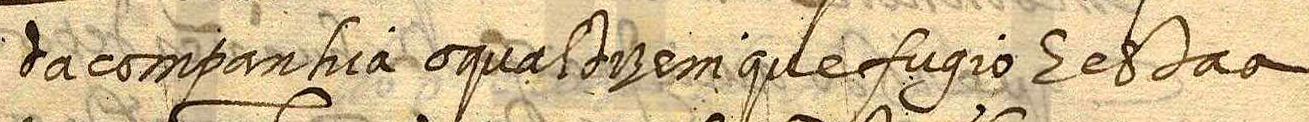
da companhia o qual dizem que fugio E estaa
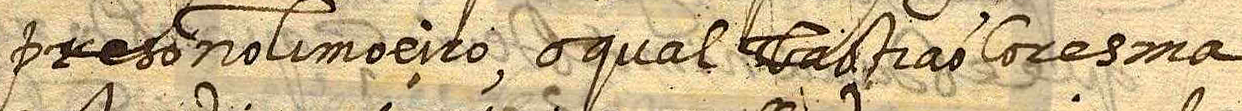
preso no limoeiro, o qual bastiaõ Coresma
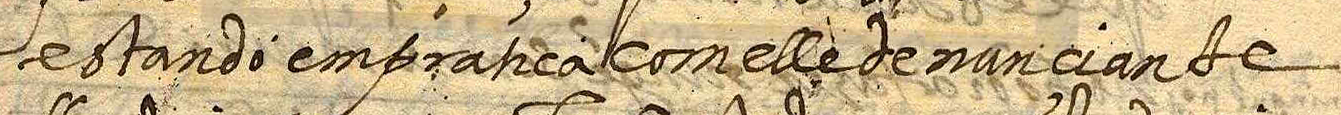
estando em pratica com elle denunçiante
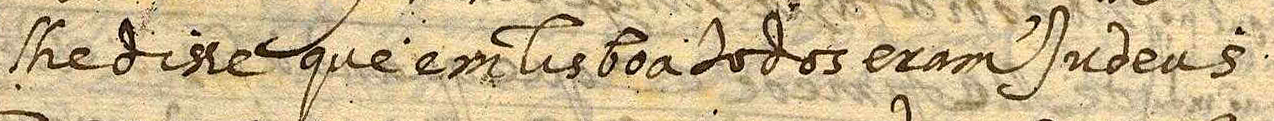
lhe disse que em lisboa todos eram Judeus
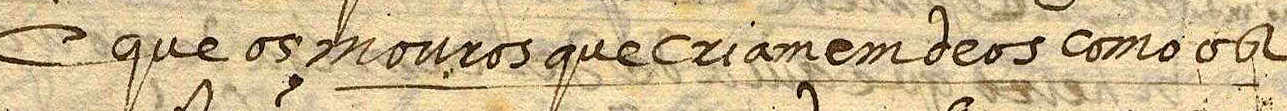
e que os mouros que criam em deos como os
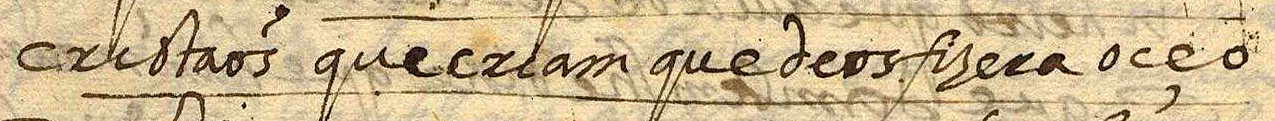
cristaos̄ que criam que deos fizera o çeo
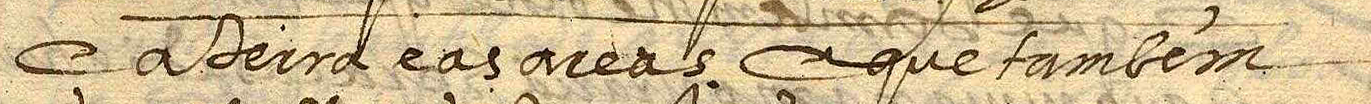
e a terra e as areas E que tambem
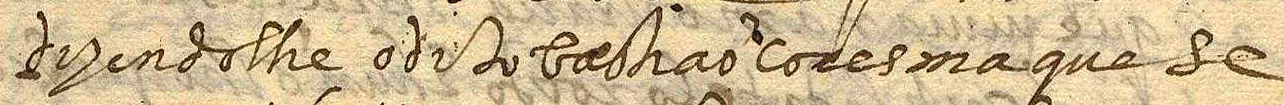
dizendolhe o dito bastiaõ coresma que se
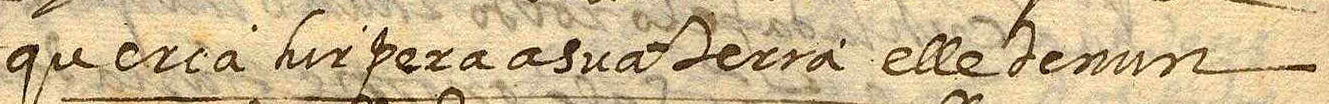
queria hir pera a sua terra elle denun
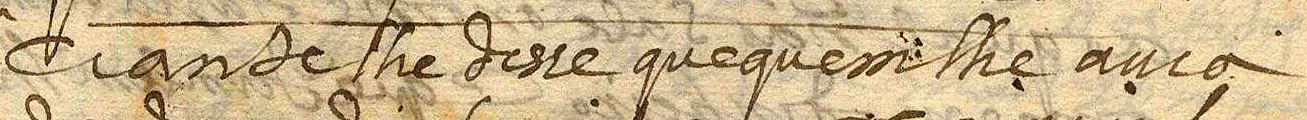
ciante lhe disse que quem lhe auia
